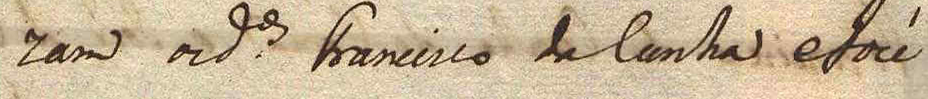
zam os d.os Francisco da Cunha e Iozé
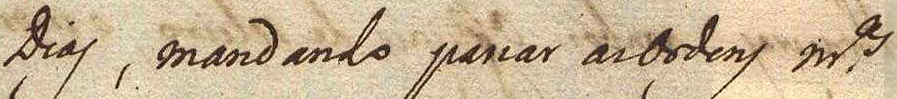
Dias, mandando passar as Ordens nr.as
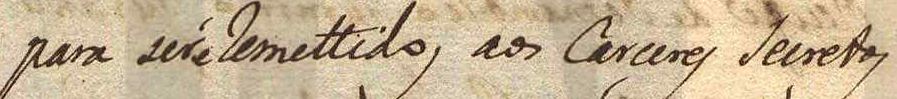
para serē Remettidos aos Carceres Secretos
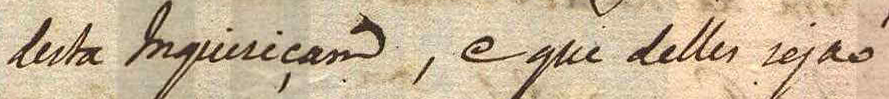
desta Inquiziçam, e que delles sejaõ
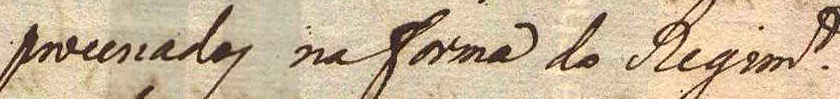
processados na forma do Regim.to
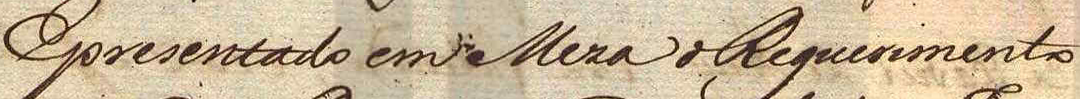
E presentado em Meza o Requerimento
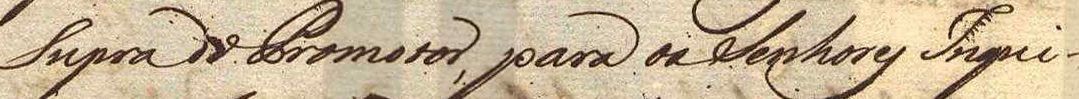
Supra do Promotor, para os Senhores Inqui
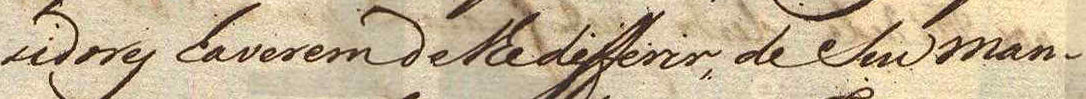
sidores haverem de lhe defferir, de Seu man
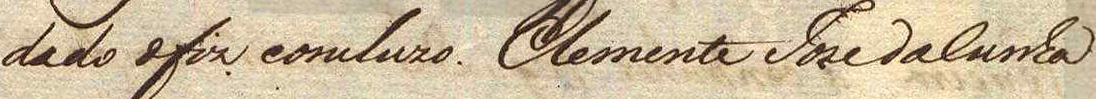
dado o fiz concluzo. Clemente Iose da Cunha
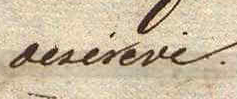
o escrevi.
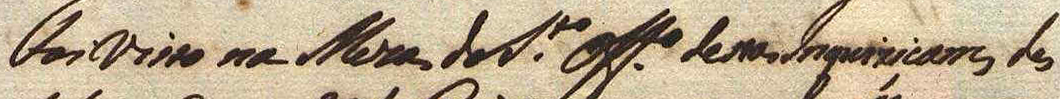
Foi Visto na Meza do S.to Off.o desta Inquiziçam de
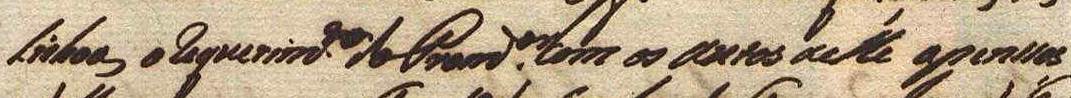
Lisboa o Requerim.to do Prom.or com os autos a elle apenssos
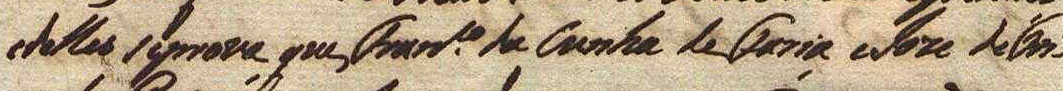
e delles se prova, que Fran.co da Cunha de Faria, e Ioze de Fri
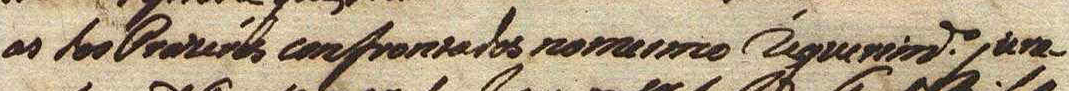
as dos Prazeres confrontados no mesmo Requerim.to jura
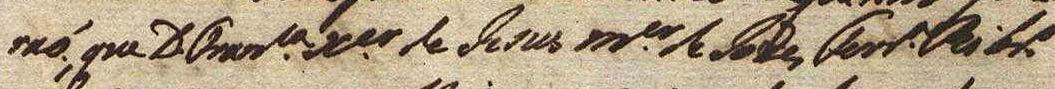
raõ; que D. Fran.ca X.er de Iesus m.er de Ioze Ferr.a Ribr.o
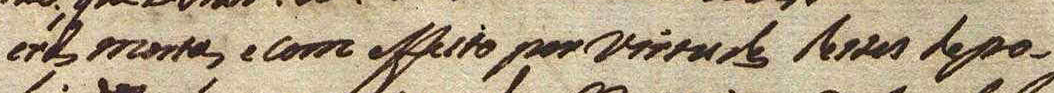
era morta, e com effeito por virtude desses depo
